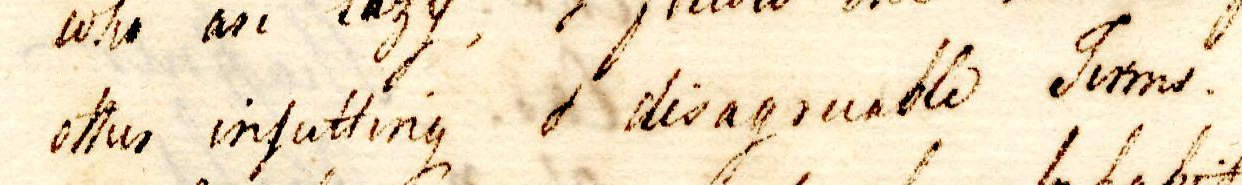others insulting & disagreeable Terms.
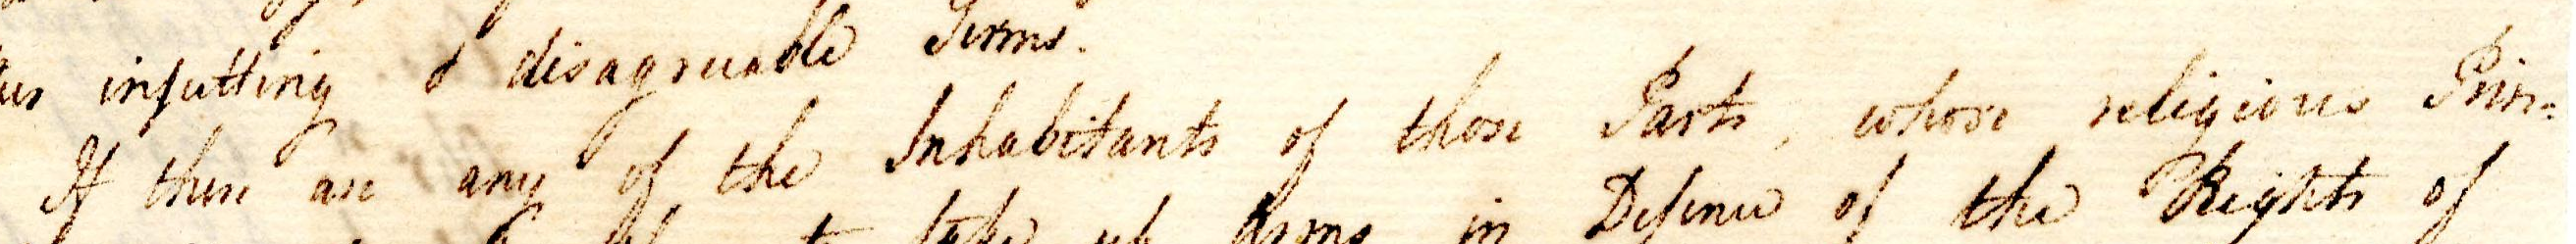If there are any of the Inhabitants of those Parts, whose religious Prin-
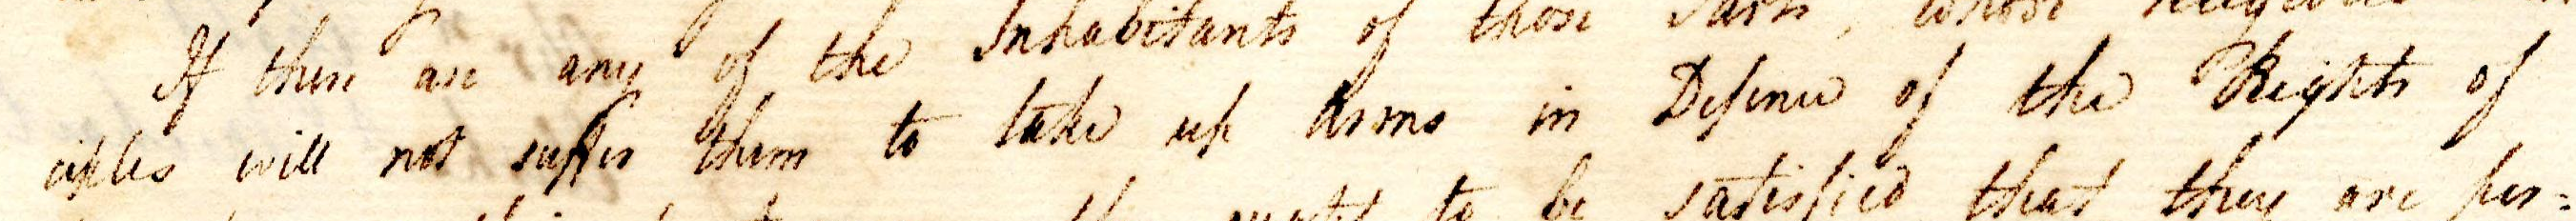-ciples will not suffer them to take up Arms in Defence of the Rights of
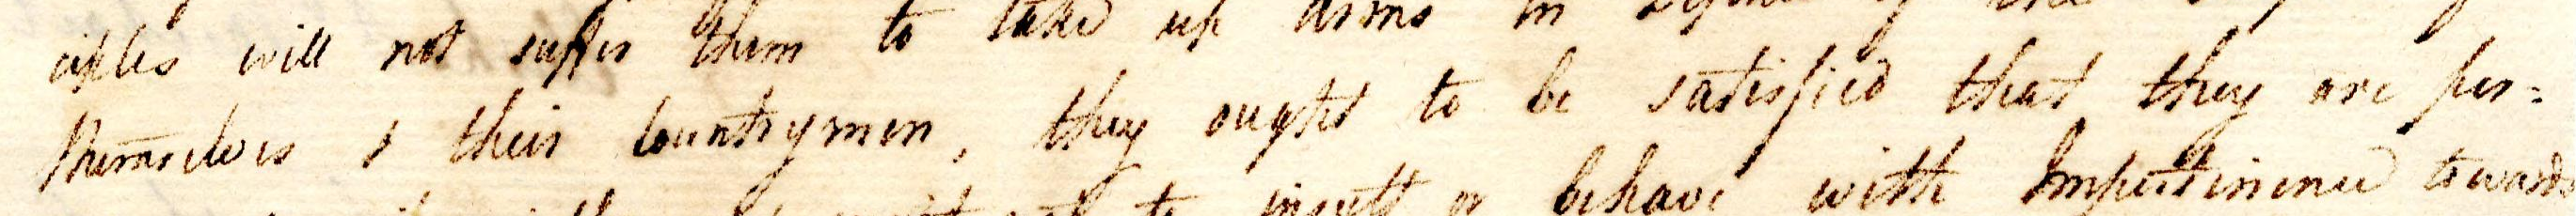themselves & their Countrymen, they ought to be satisfied that they are per-
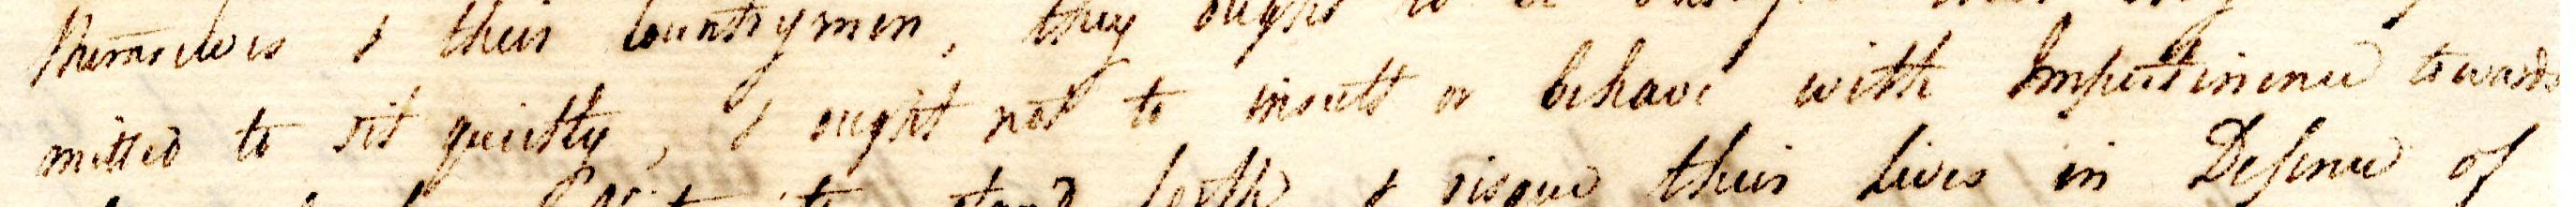-mitted to sit quietly. I ought not to insult or behave with Impertinence towards
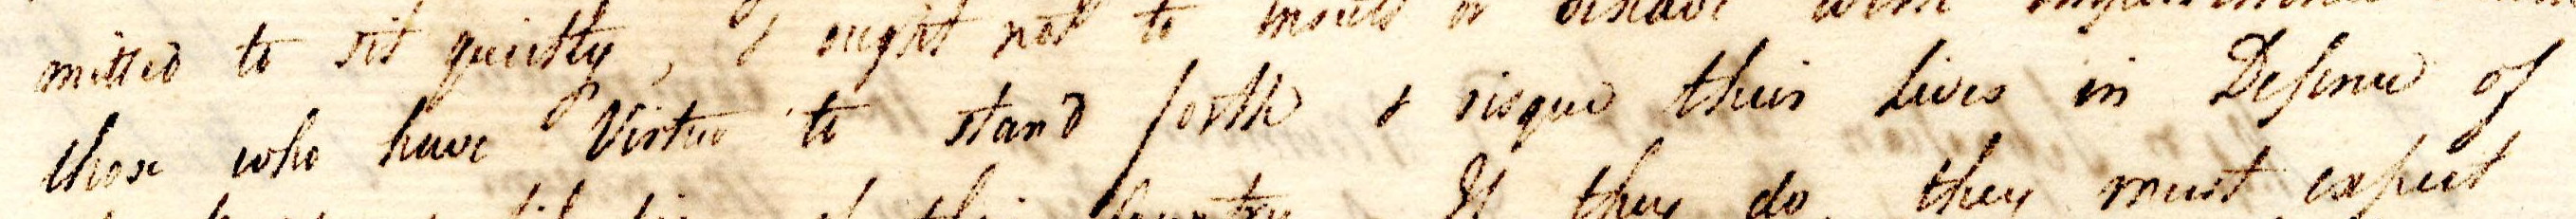those who have Virtue to stand forth & risque their Lives in Defence of
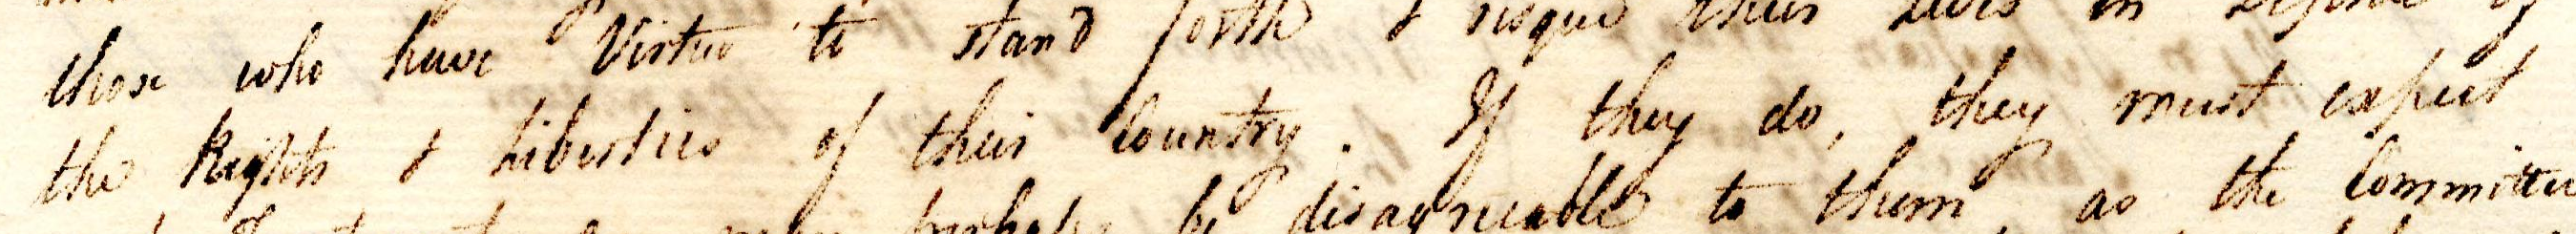the Rights & Liberties of their Country. If they do, they must expect
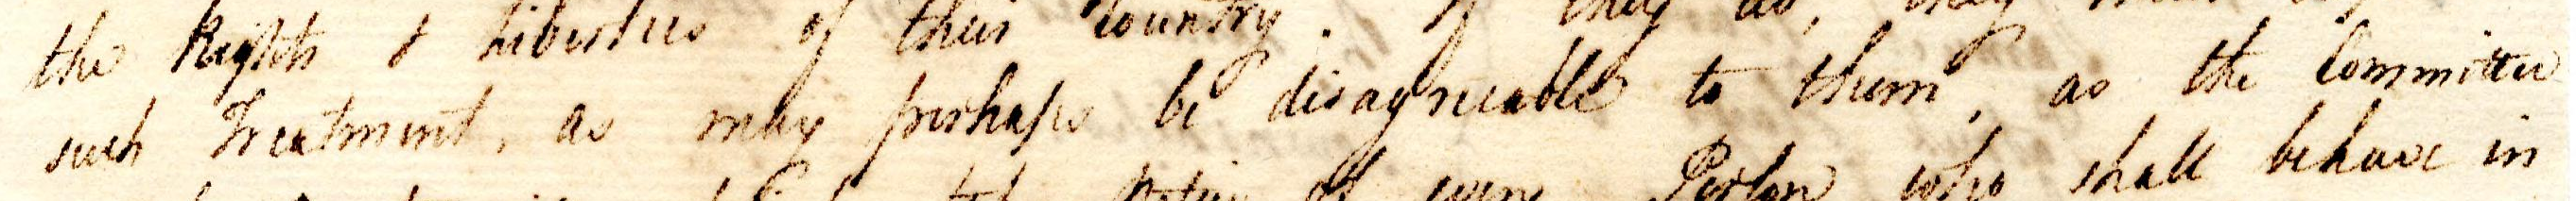such Treatment, as may perhaps be disagreeable to them, as the Committee
